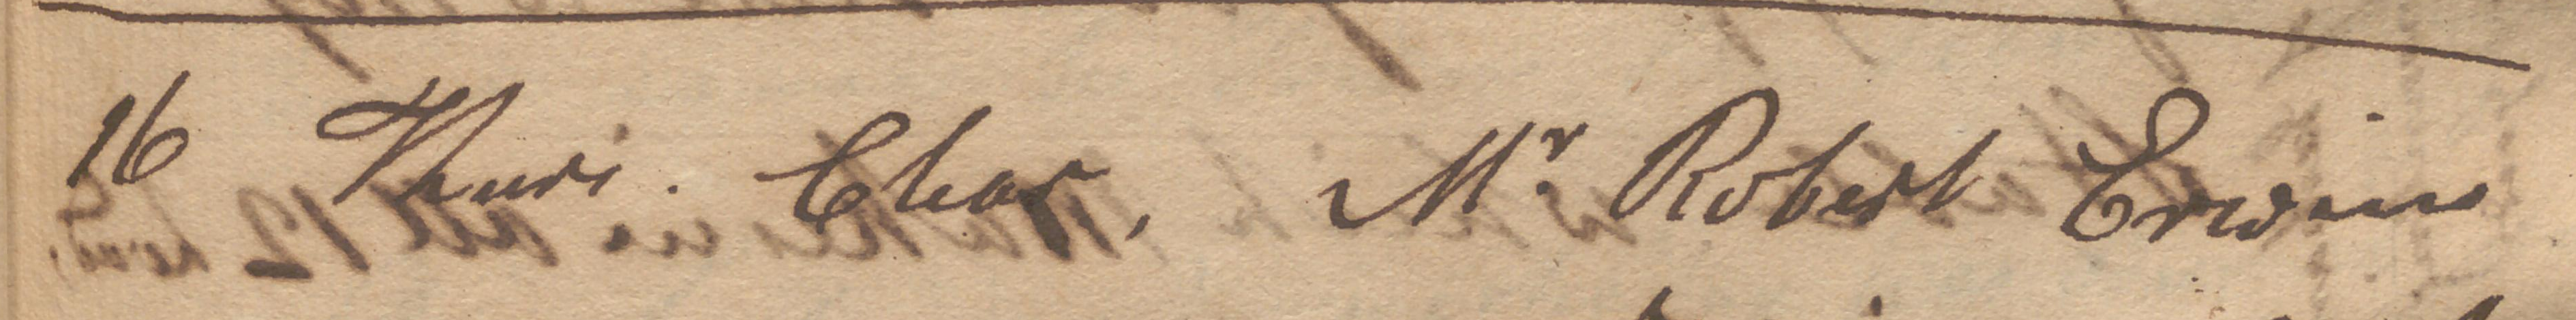16 Thurs Clear M^r Robert Erwins
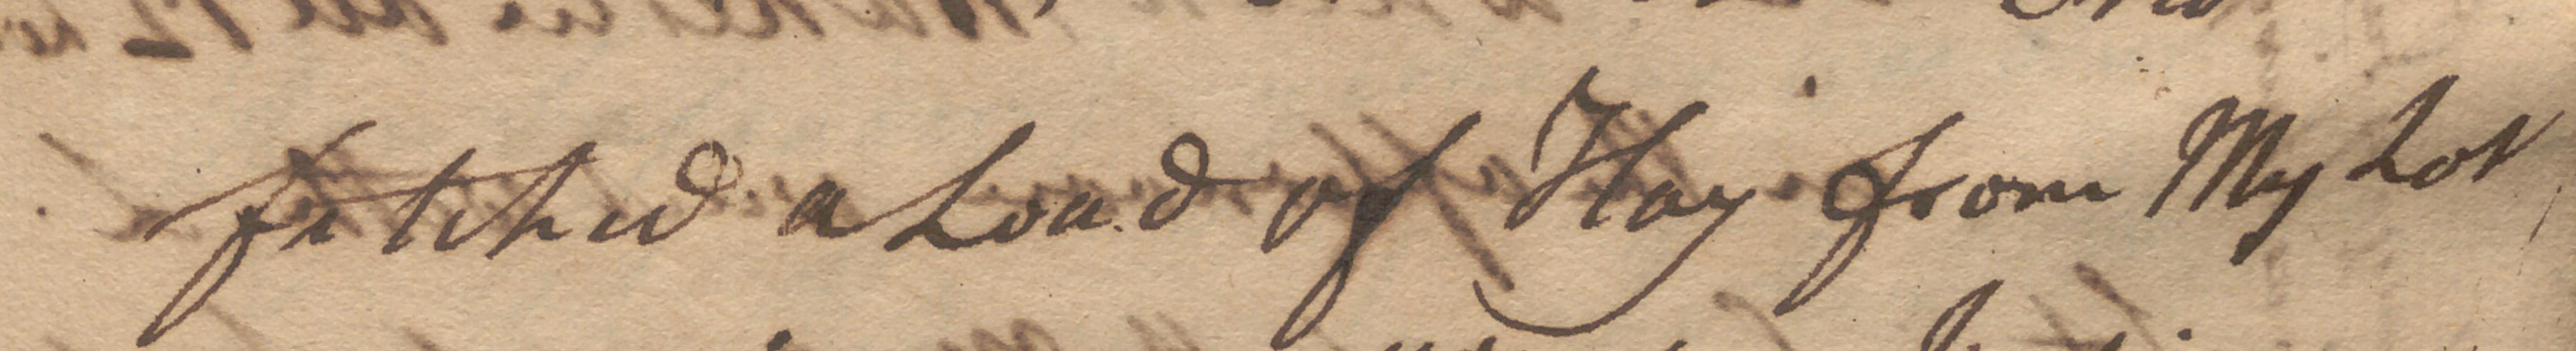fetched a Load of Hay from My Lot
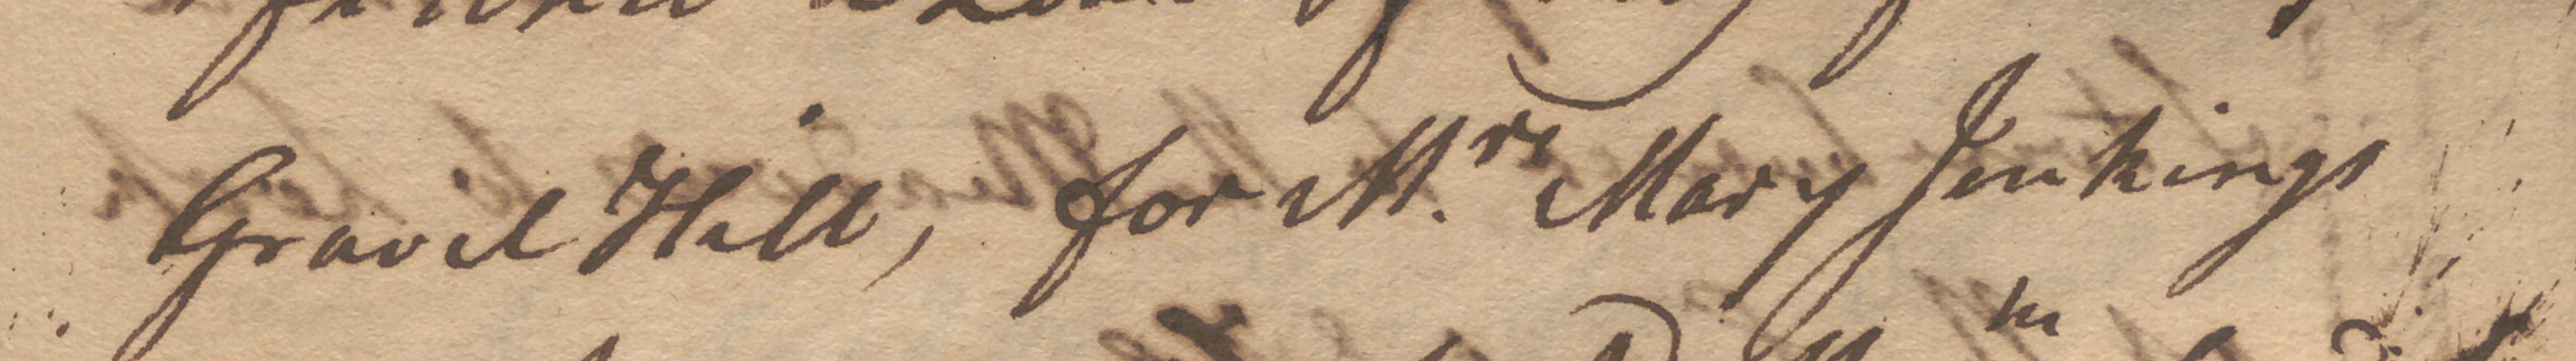Gravel Hill, for M^rs. Mary Jenkings,
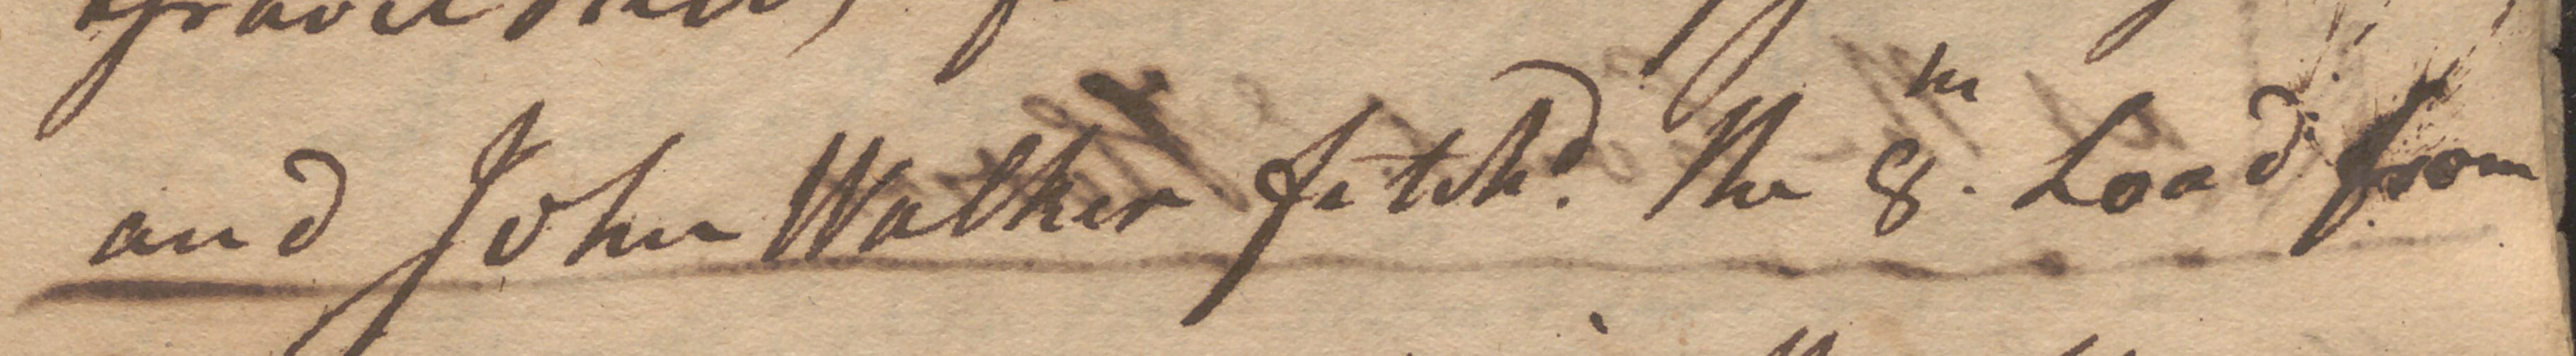and John Walker fetch^d. the 8^th. Load from
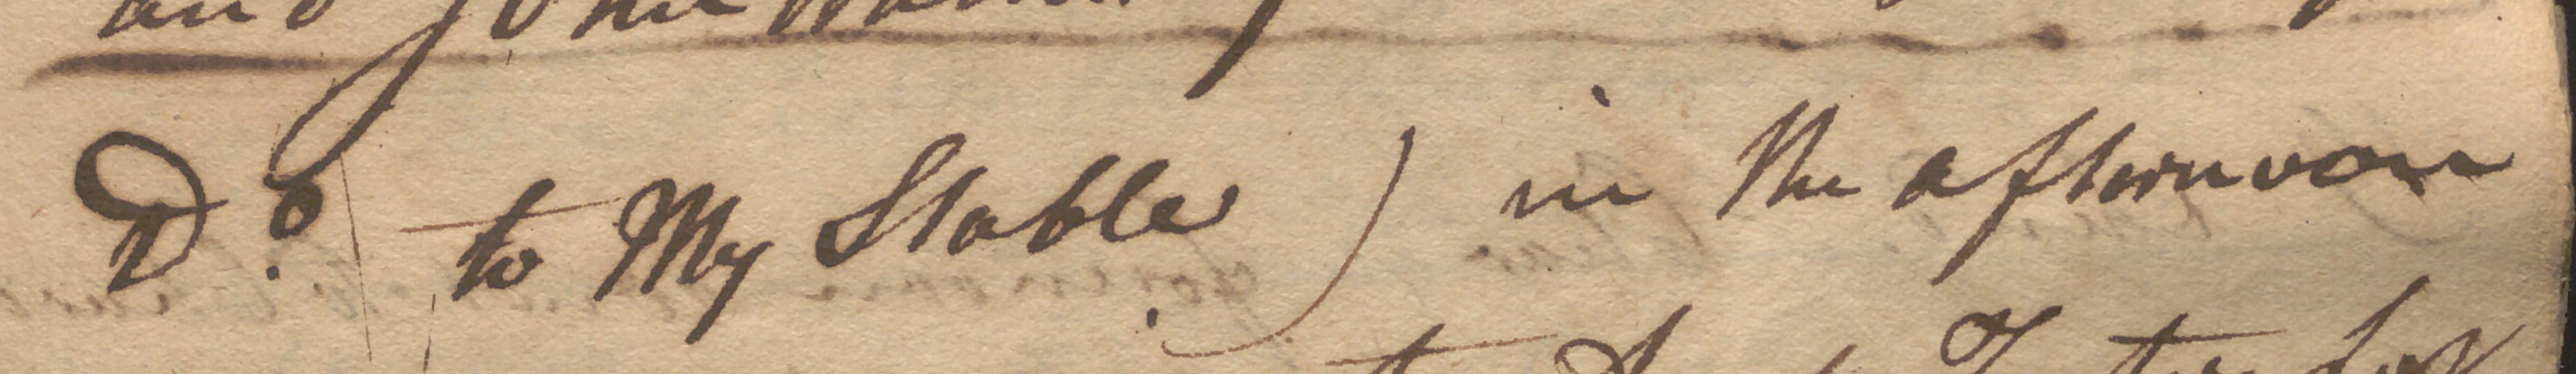D^o. to My Stable) in the afternoon
